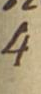4
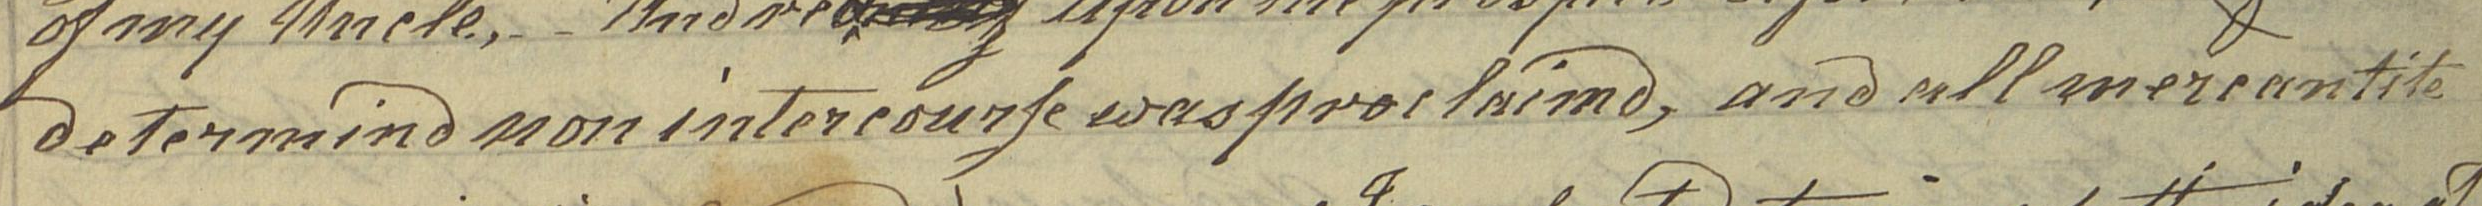determind non intercourse was proclaimd, and all mercantile
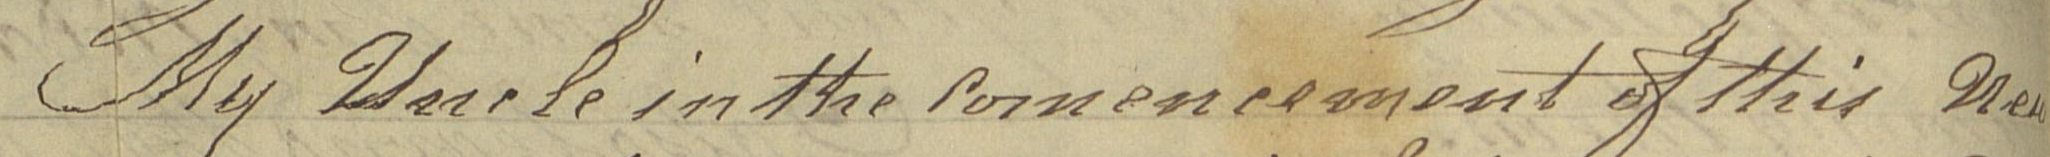My Uncle in the comencement of this New
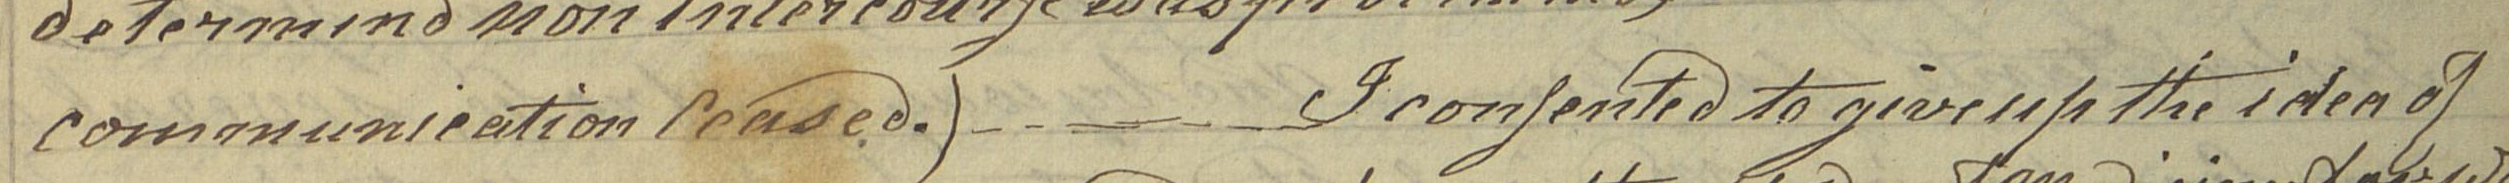communication ceased.) I consented to give up the idea of
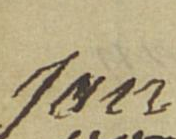Jan
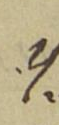4.
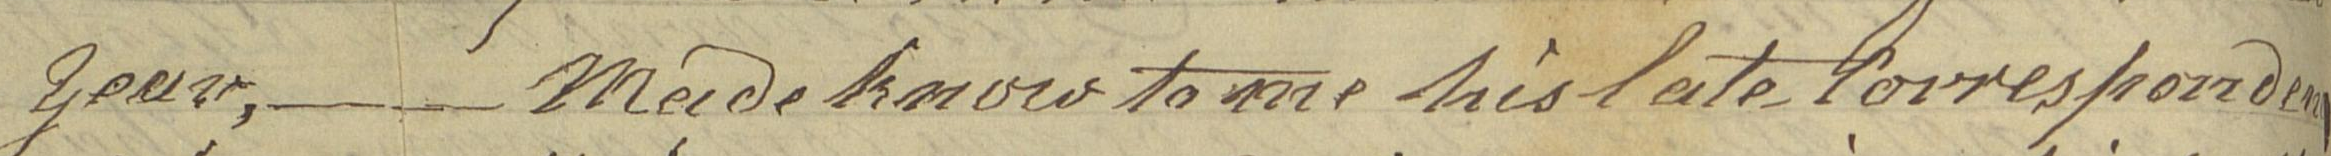Year, made know to me his late Correspondence
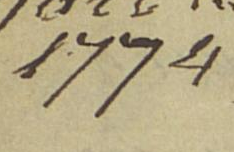1774
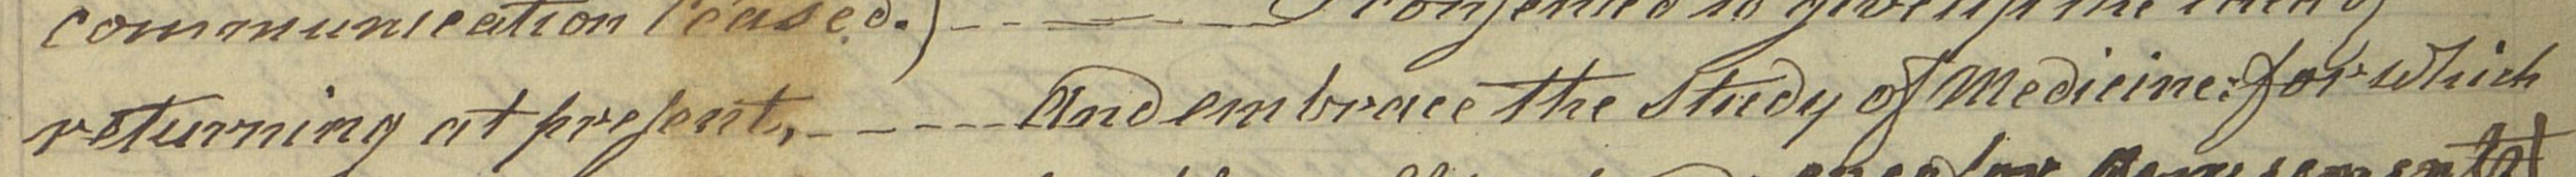returning at present, And embrace the Study of Medicine for which
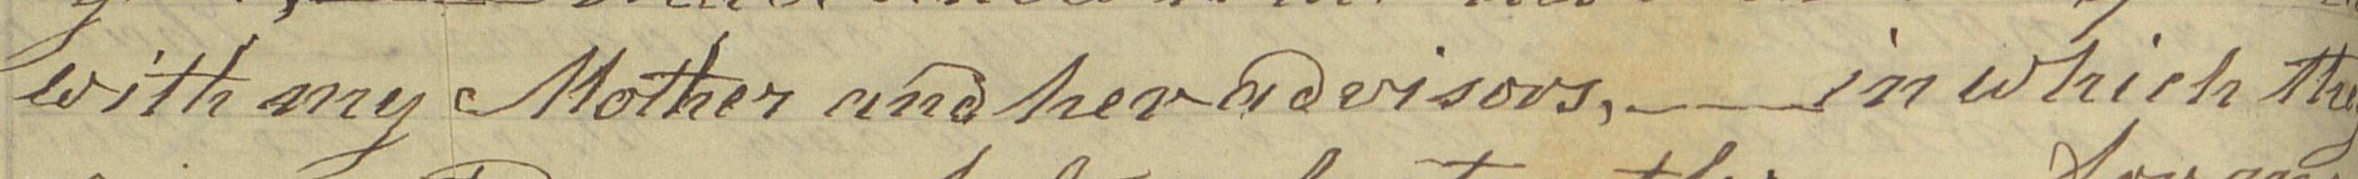with my Mother and her advisors, in which they
